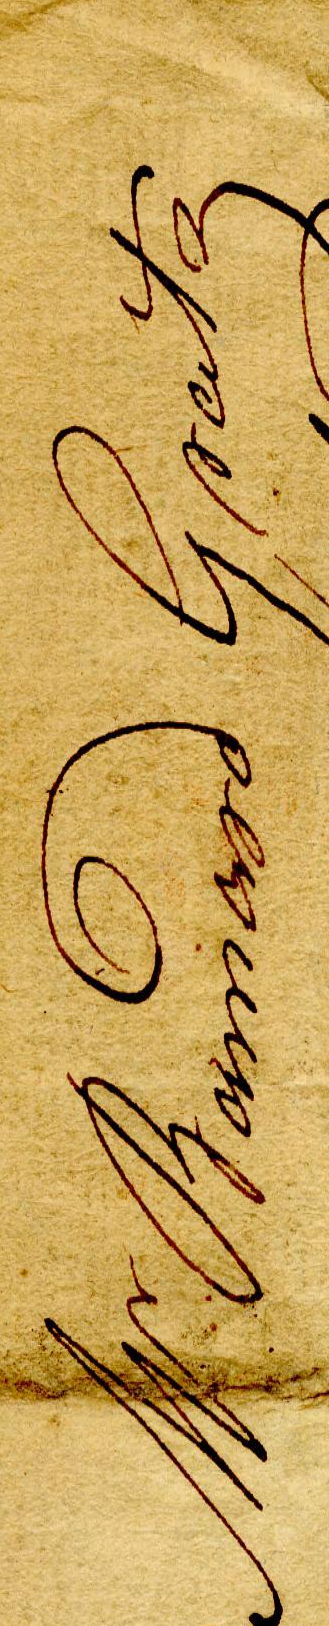M^r Barnard Gratz
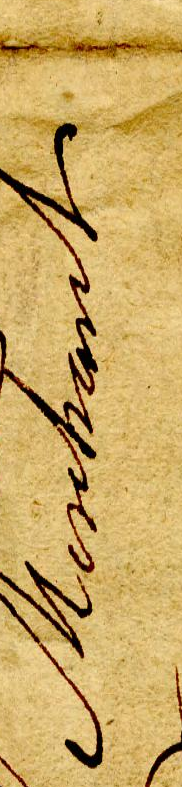Merchant
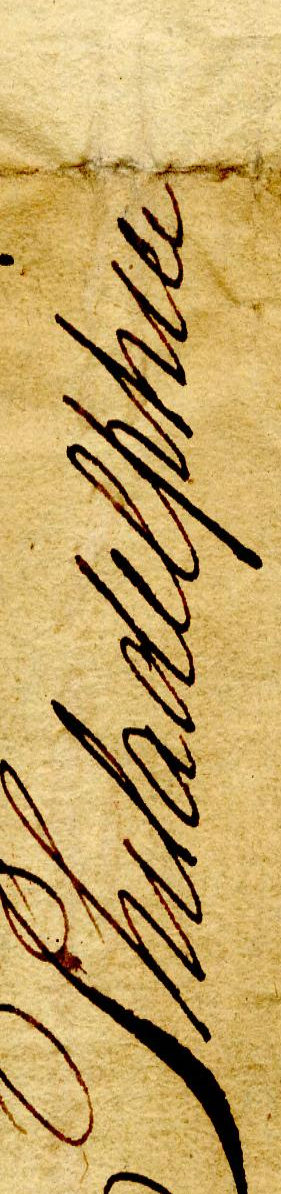Philadelphia
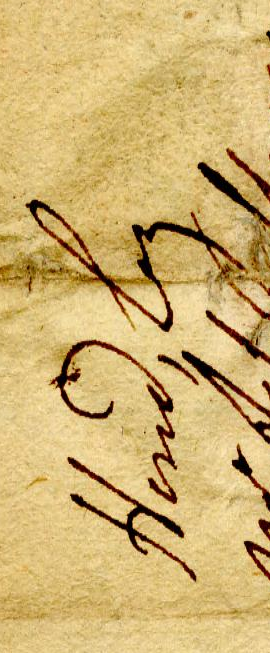Hand, by
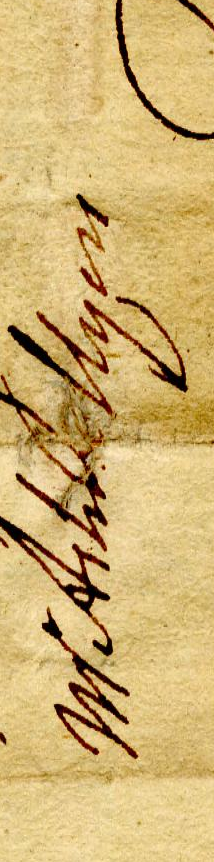M^r Ab Myers
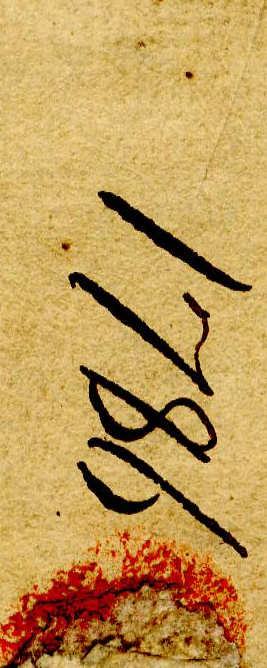1786
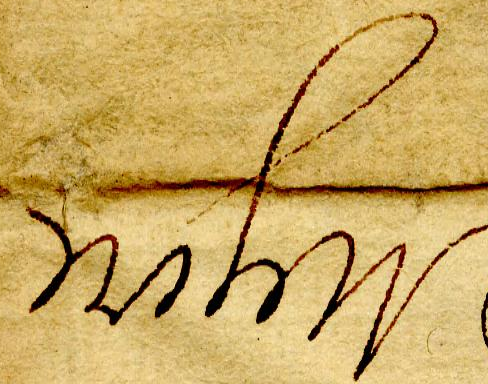Myers
